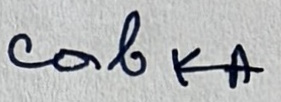савка
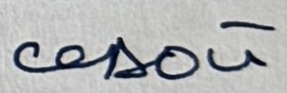седой
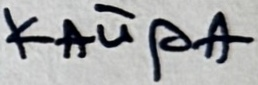кайра
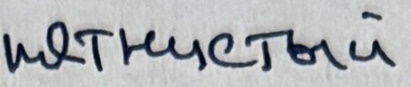пятнистый
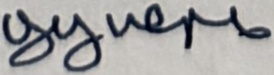дупель
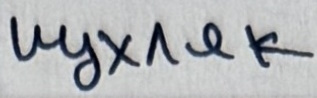пухляк
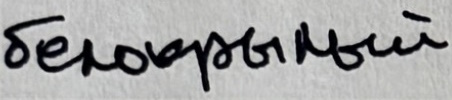белокрылый
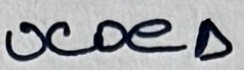осоед
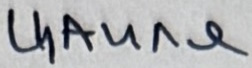цапля
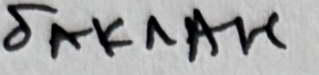баклан
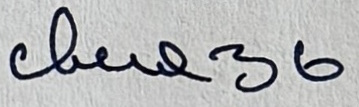свиязь
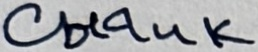сычик
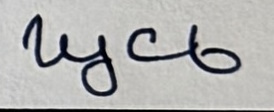гусь
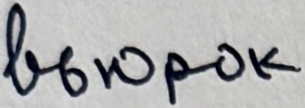вьюрок
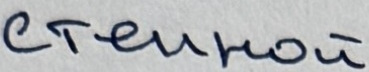степной
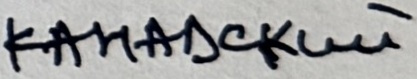канадский
